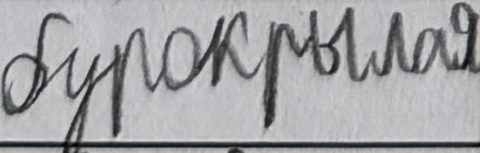бурокрылая
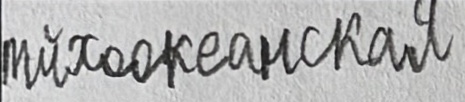тйхоокеанская
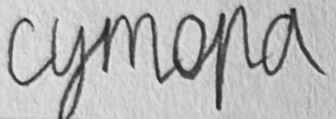сутора
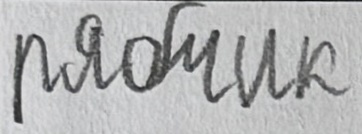рябчик
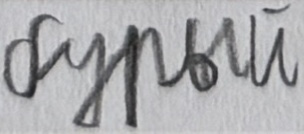бурый
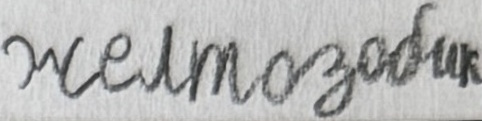желтозобик
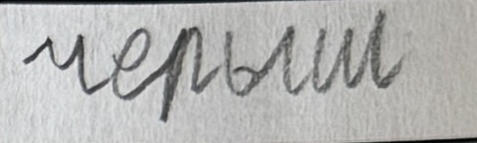черыш
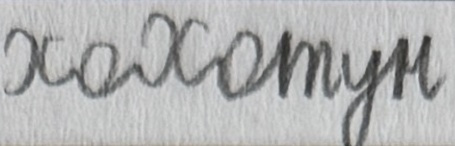хохотун
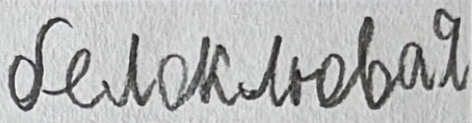белоклювая
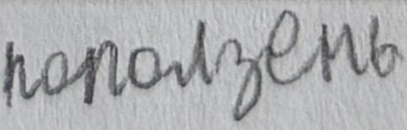поползень
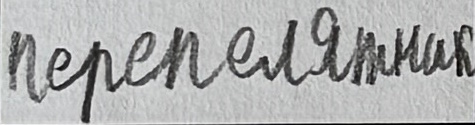перепелятник
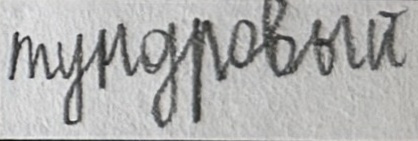тундровый
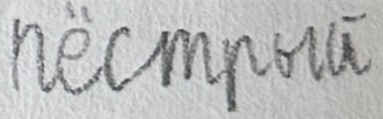пёстрый
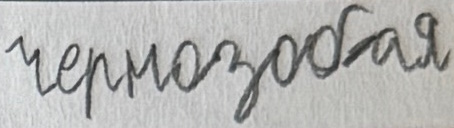чернозобая
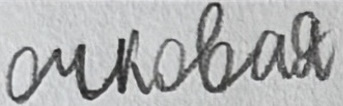очковая
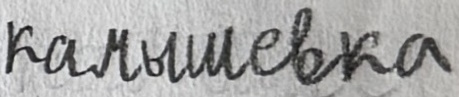камышевка
